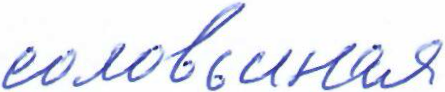соловьиная
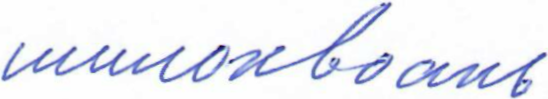шилохвость
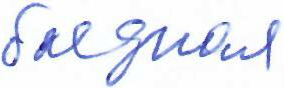бледная
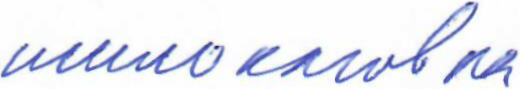шилоклювка
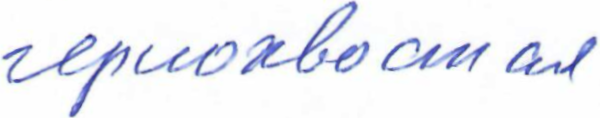чернохвостая
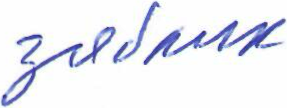зяблик
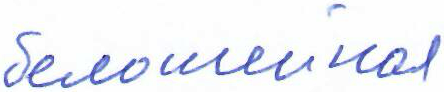белошейная
